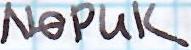люрик
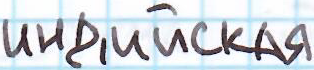индийская
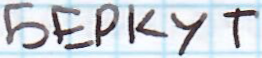беркут
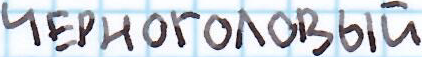черноголовый
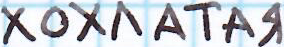хохлатая
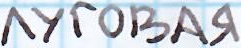луговая
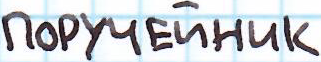поручейник
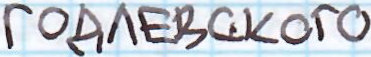годлевского
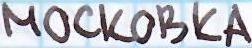московка
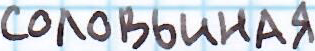соловьиная
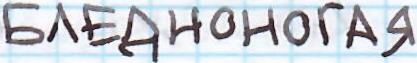бледноногая
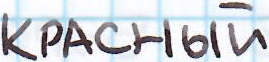красный
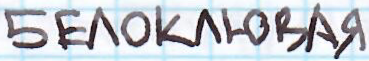белоклювая
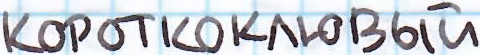короткоклювый
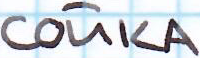сойка
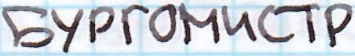бургомистр
